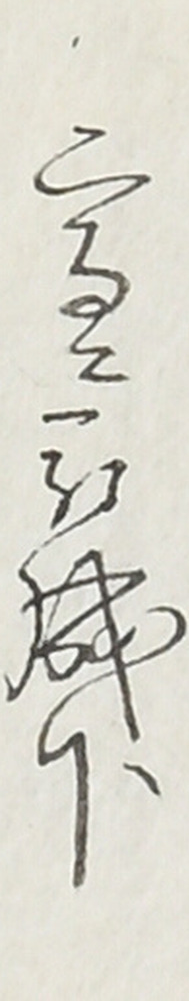高ニ被成下
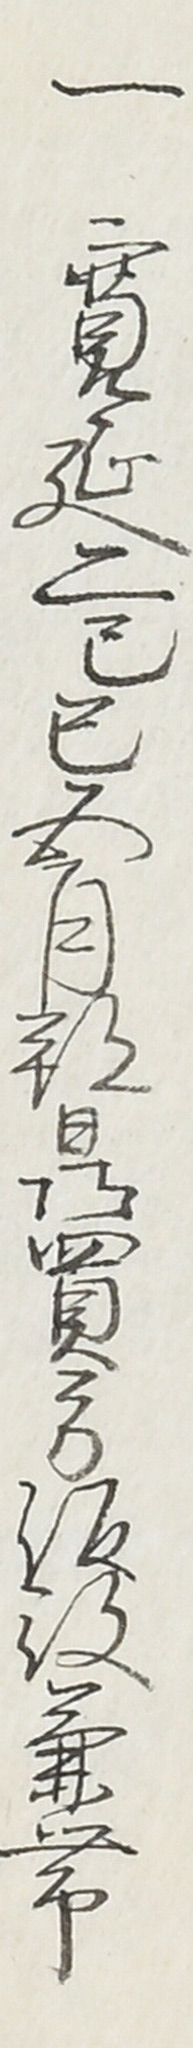一寛延二己巳五月朔日御買方仮役兼帯
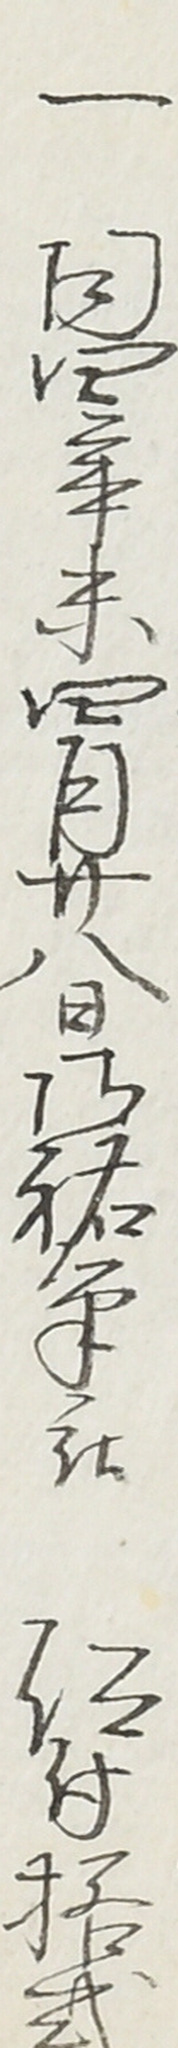一同四辛未四月廿八日御祐筆被仰付格式
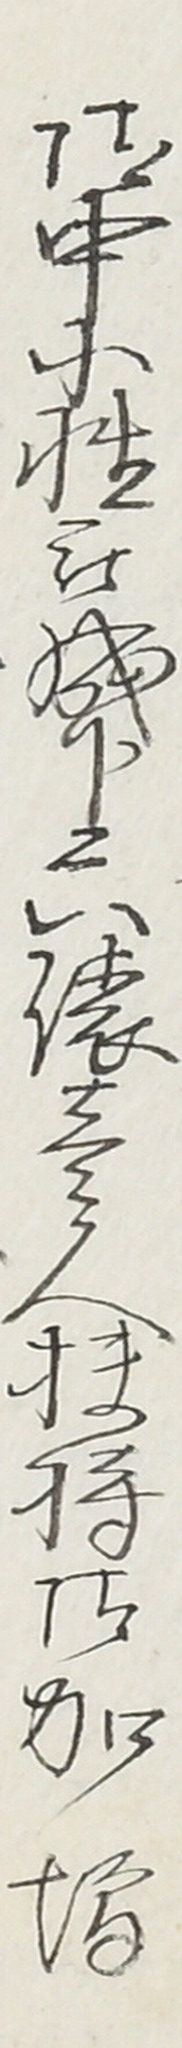御中小性被成下六俵壱人扶持御加増
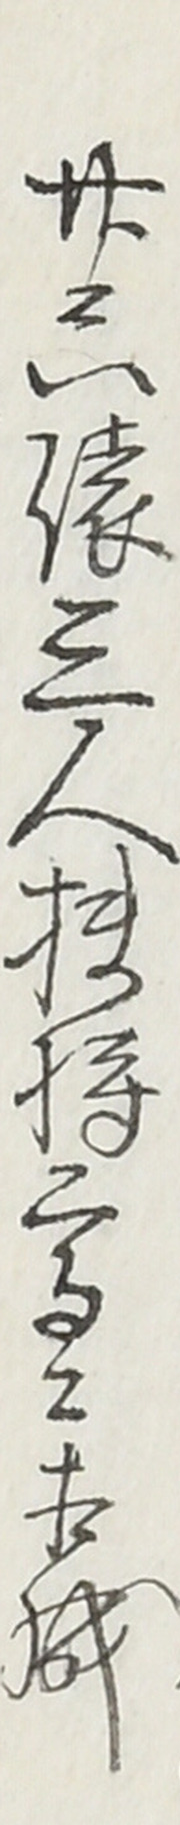廿六俵三人扶持高ニ相成
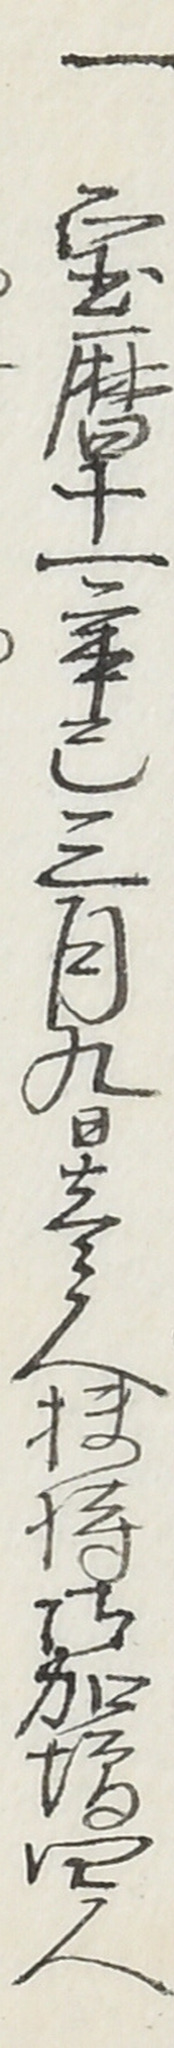一宝暦十一辛巳三月九日壱人扶持御加増四人

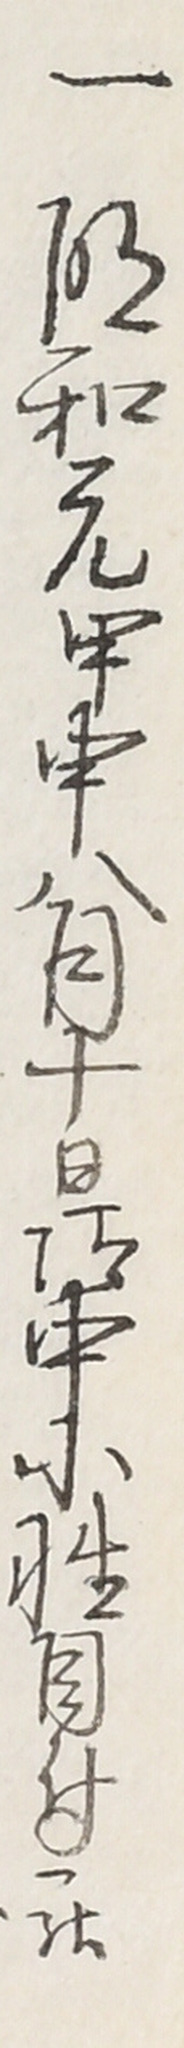一明和元甲申八月十日御中小性目付被
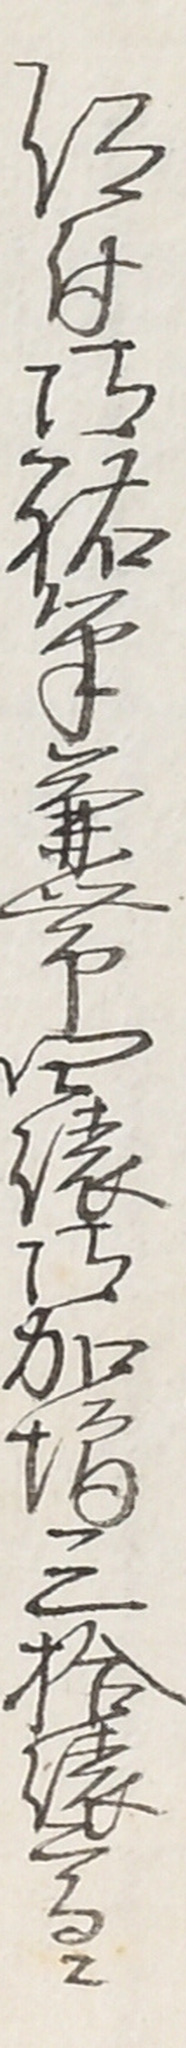仰付御祐筆兼帯四俵御加増三拾俵高ニ
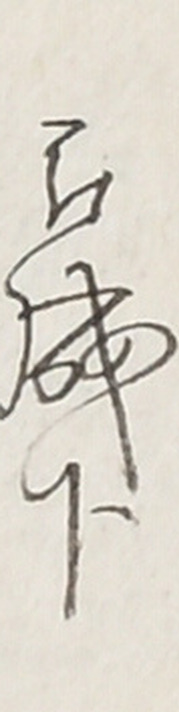被成下
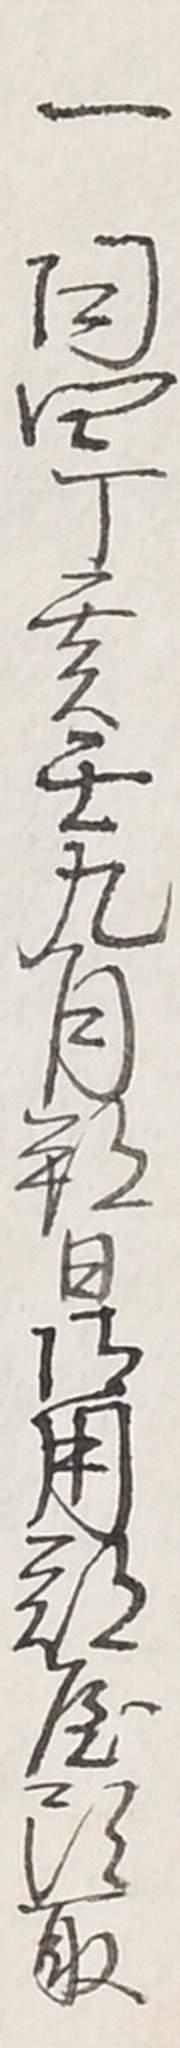一同四丁亥閏九月朔日御用部屋頭取
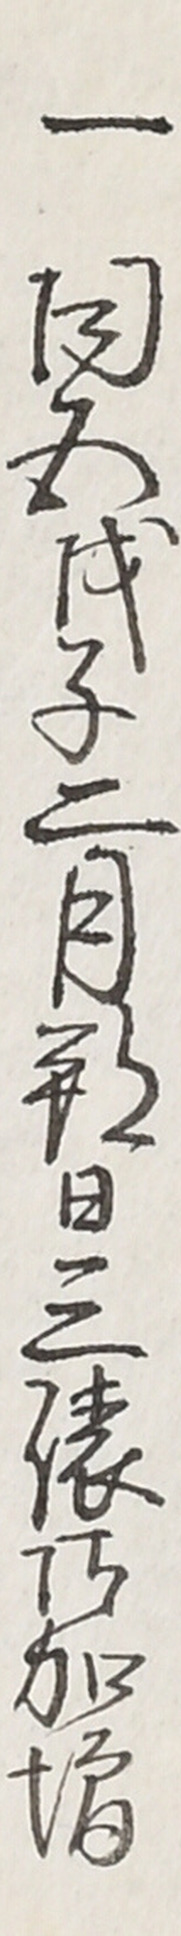一同五戊子二月朔日三俵御加増
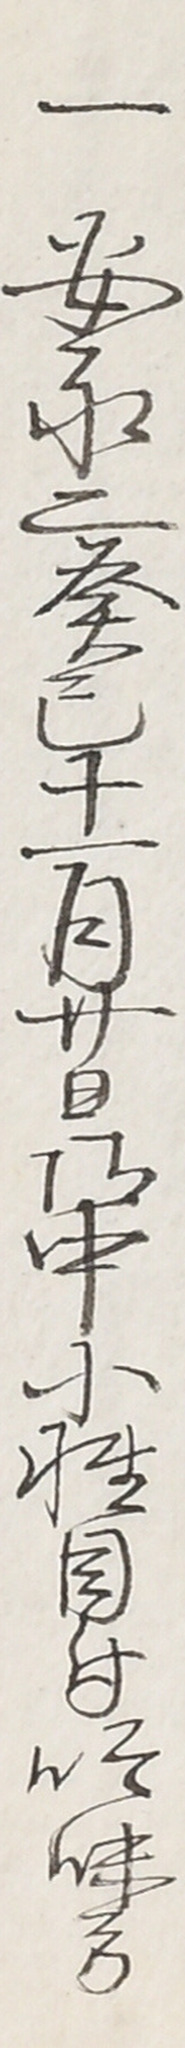一安永二癸巳年十一月廿日御中小性目付吟味方
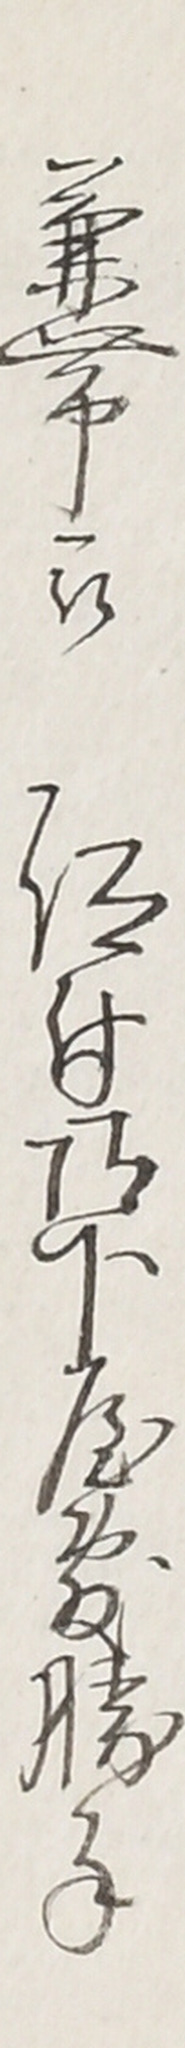兼帯被仰付御下屋敷勝手
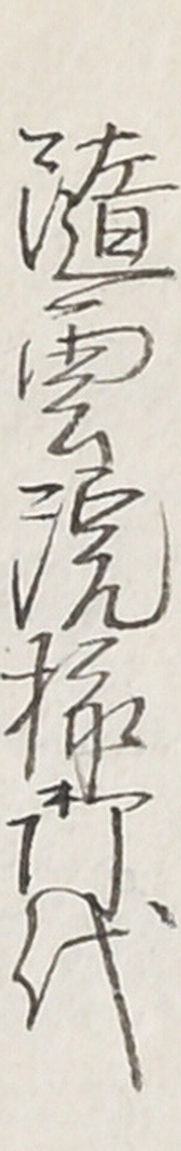隨雲院様御代
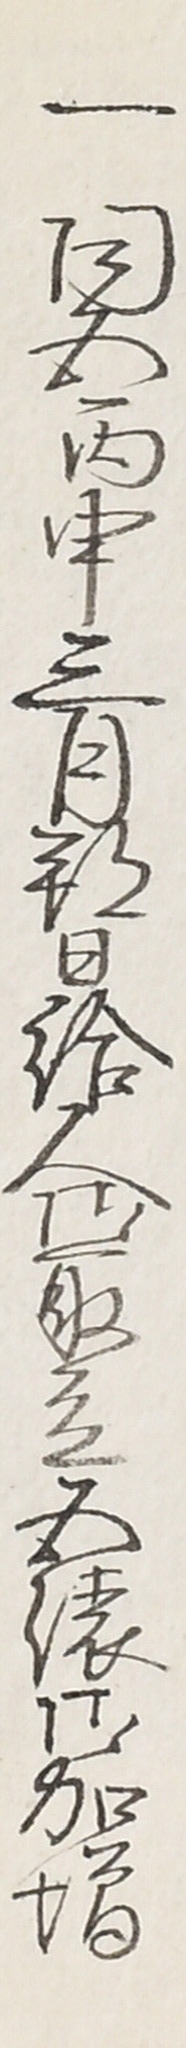一同五丙申三月朔日給人御取立五俵御加増
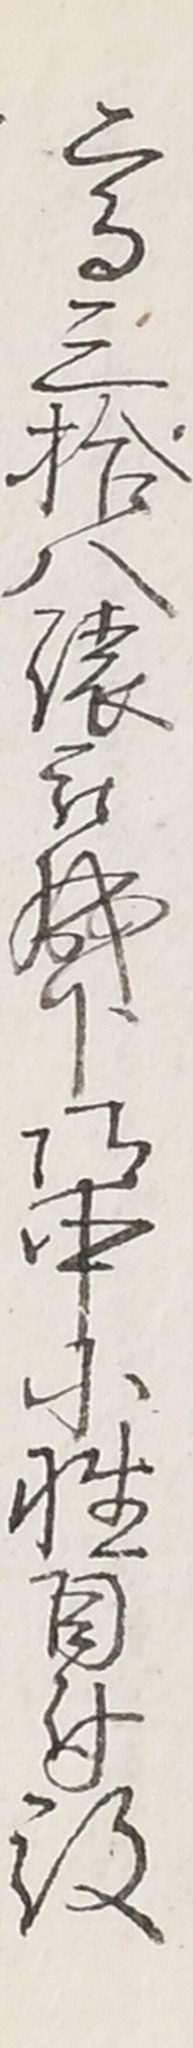高三拾八俵被成下御中小性目付役
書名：給人諸士勤仕録（七）
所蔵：伊那市立高遠町図書館・合同会社AMANE
